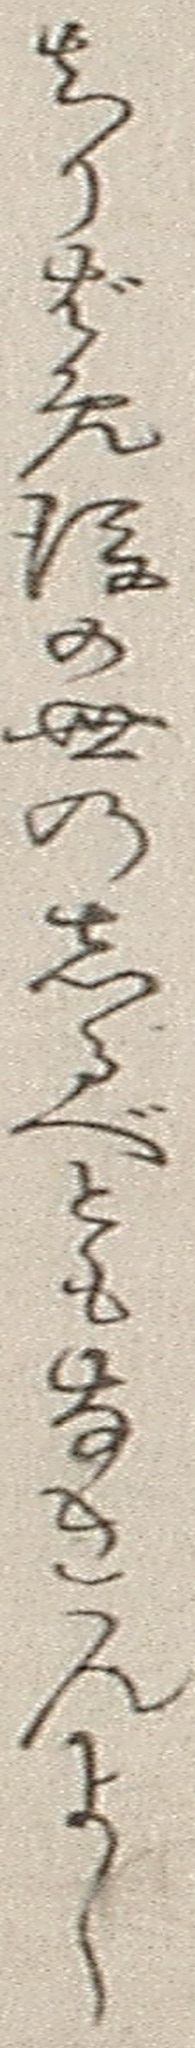ちりばめ後の世のしるべともなさんよし

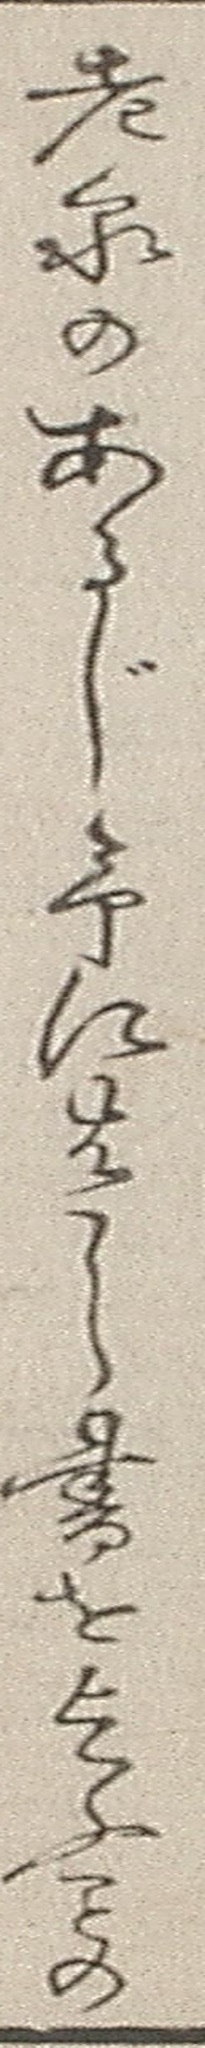老家のあるじ予にはし書を与ふことの
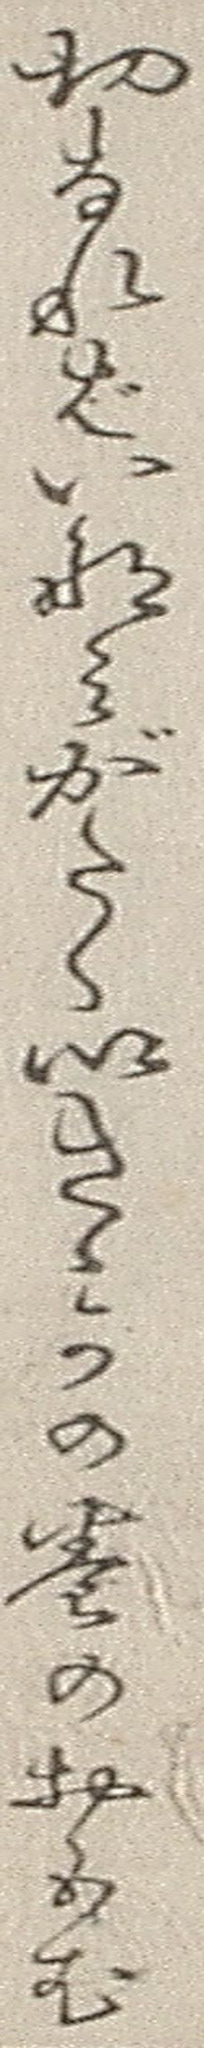切なればいなみがたくいさゝかの巻のおもむ
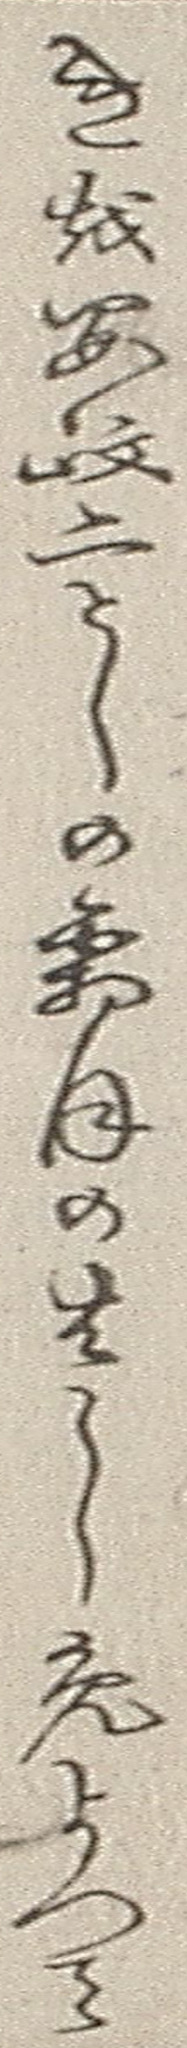きを安政二としの霜月のはしめよつて
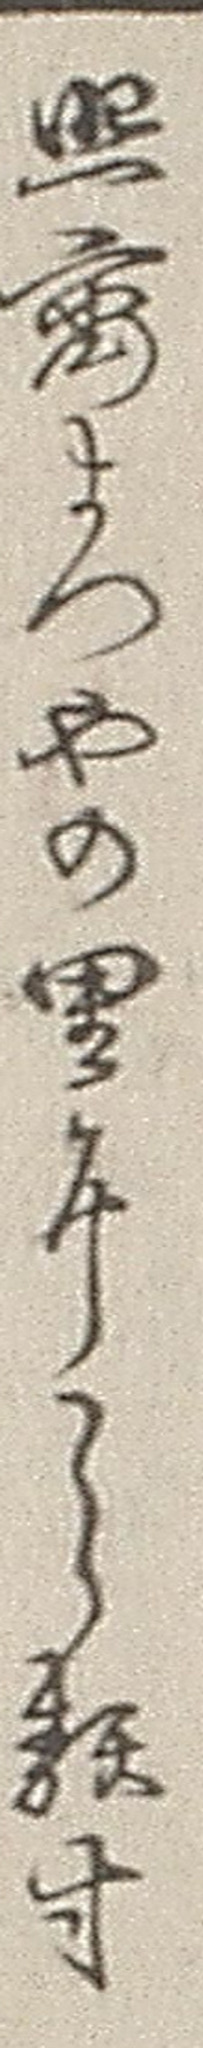照寓よつやの里にて錄す
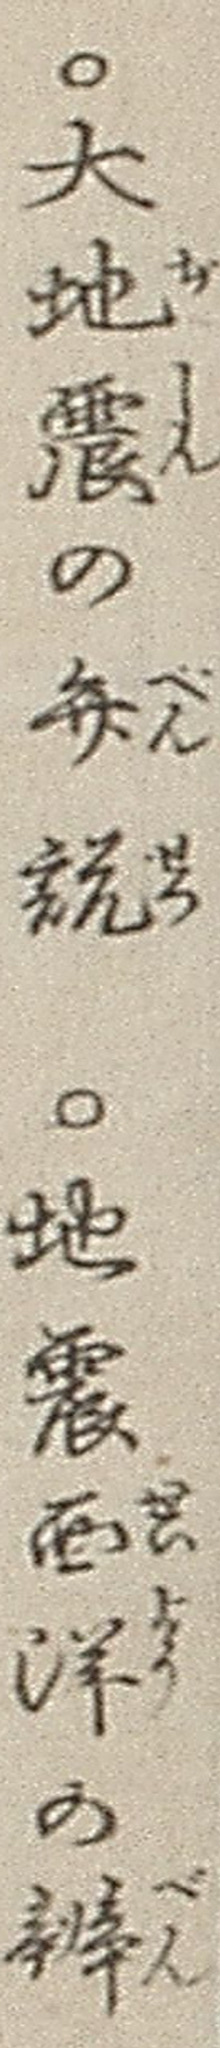○大地震の弁説○地震西洋の弁
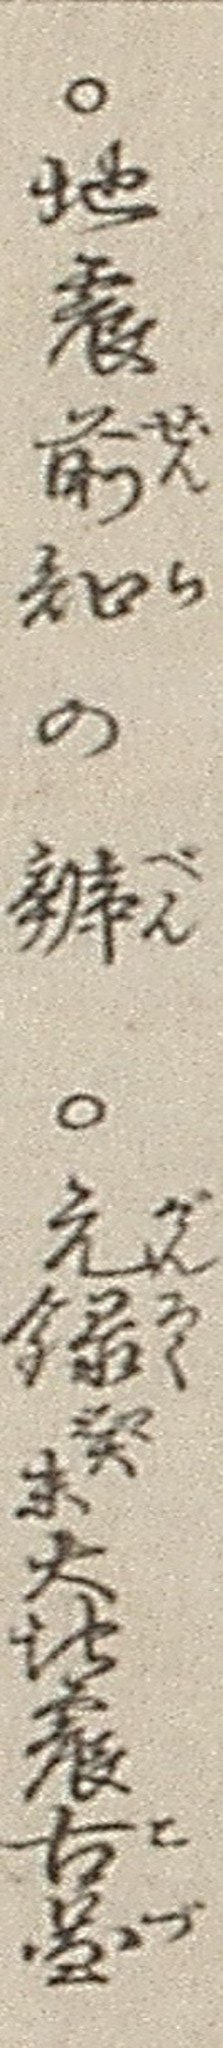○地震前知の弁○元禄癸未大地震古図
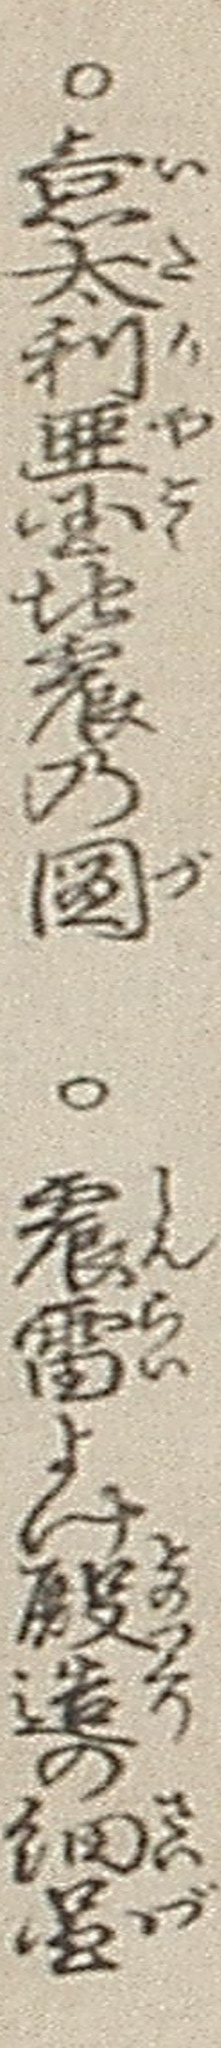○意太利亜国地震の図○震雷よけ殿造の細図
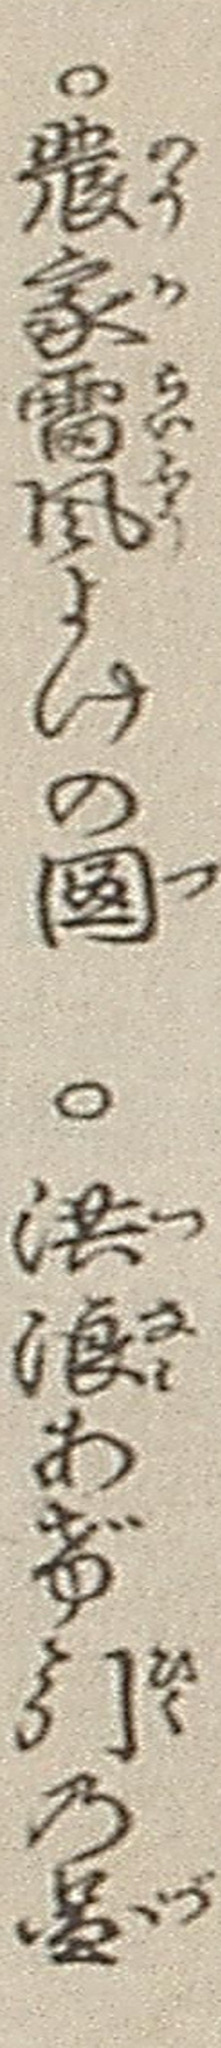○農家雷風よけの図○洪浪あげ引の図
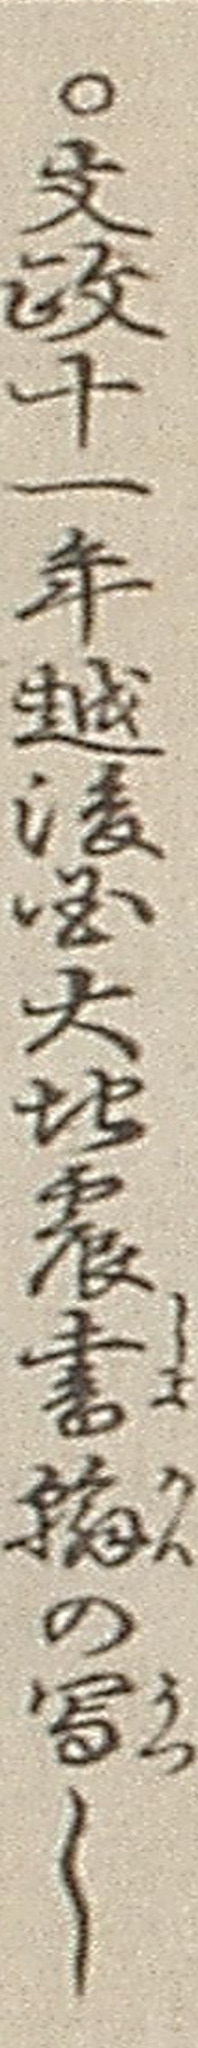○文政十一年越後国大地震書翰の写し
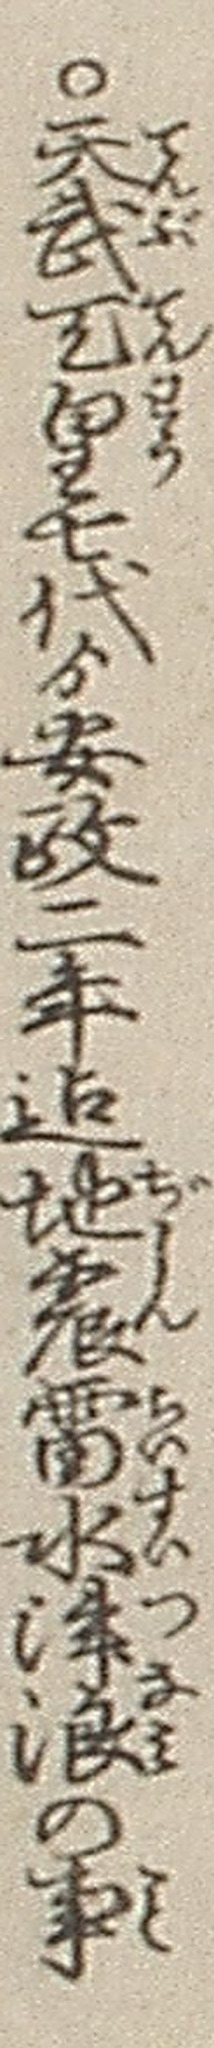○天武天皇七代ゟ安政二年迄地震雷水津浪の事

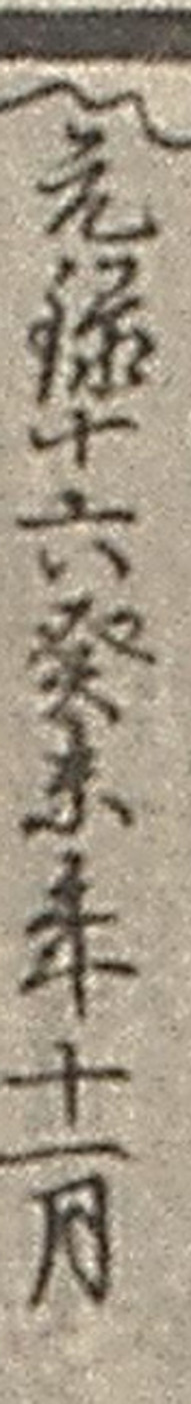元禄十六癸未年十一月
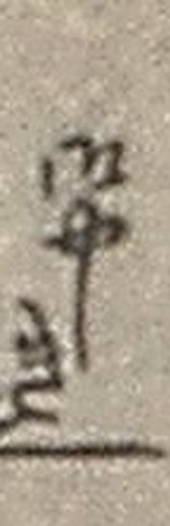御やしき
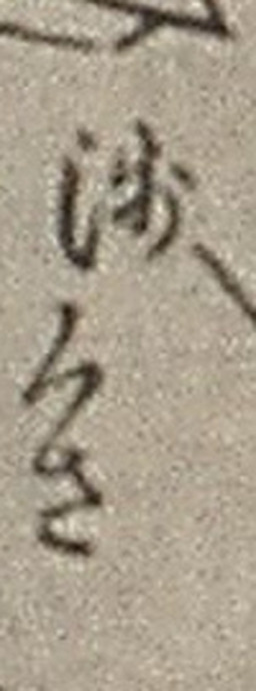浅くさ
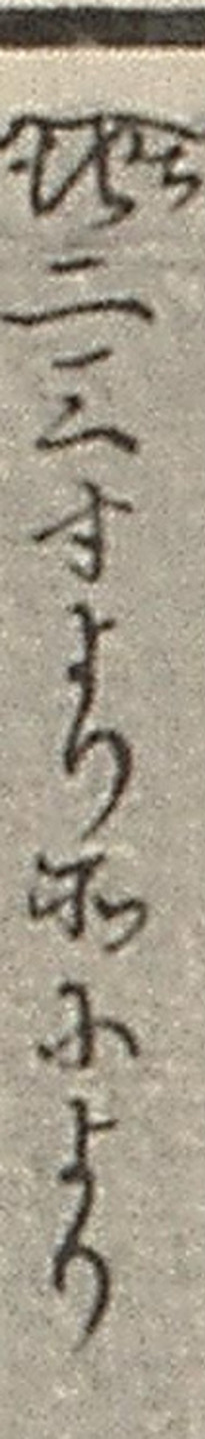地二三寸より所により
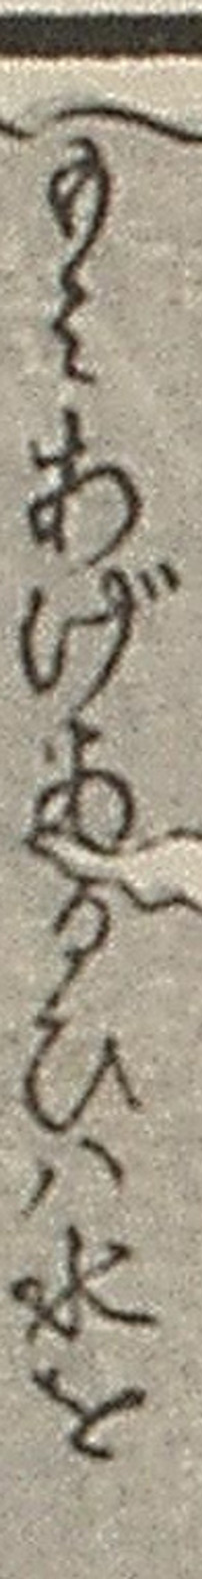もみあげあるひは水を
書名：大地震暦年考　全
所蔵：東京大学地震研究所図書室 Earthquake Research Institute Library, The University of Tokyo, JAPAN
